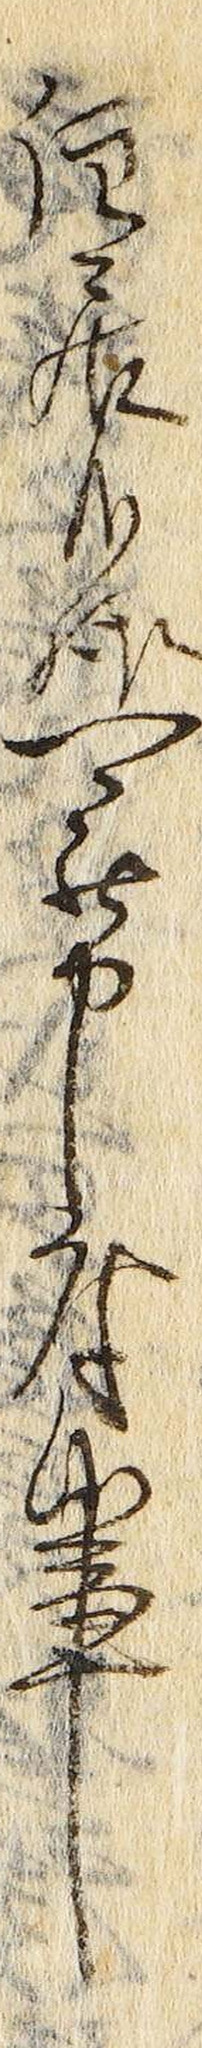住居候様可被申付候事
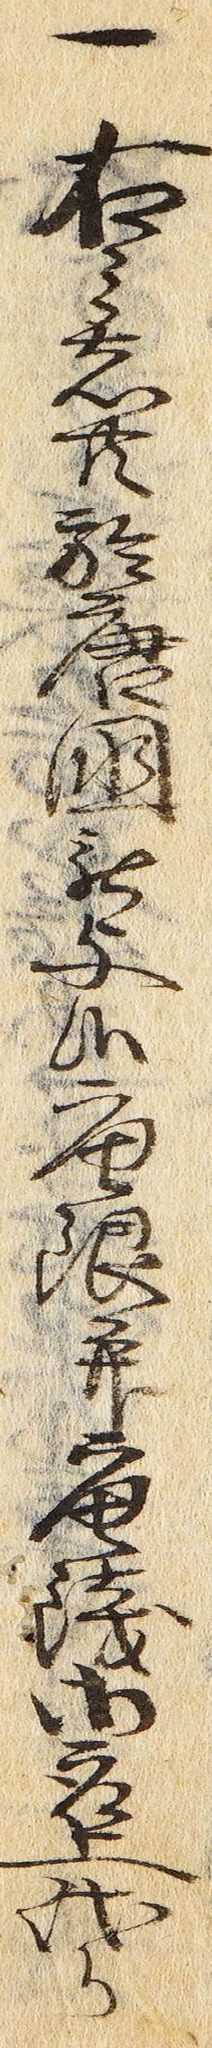一右之者共於唐国被与候唐銀幷唐銭御取上代り
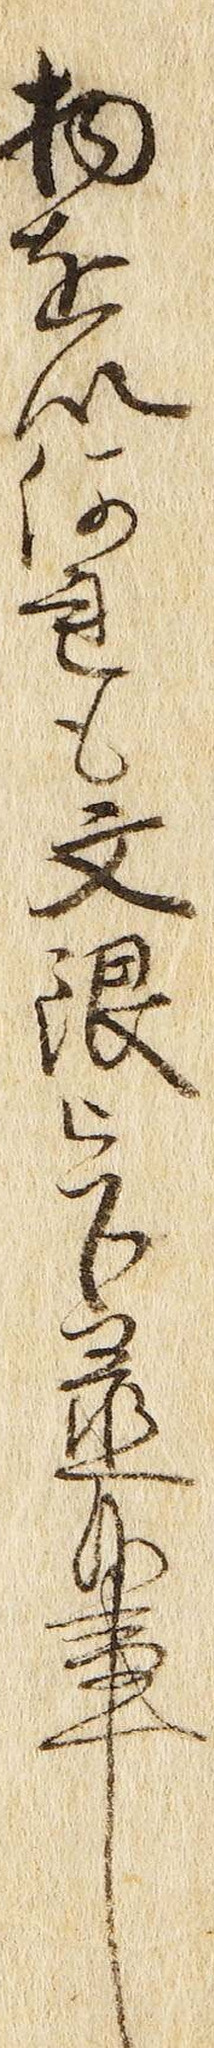物を以何れも文銀被下置候事
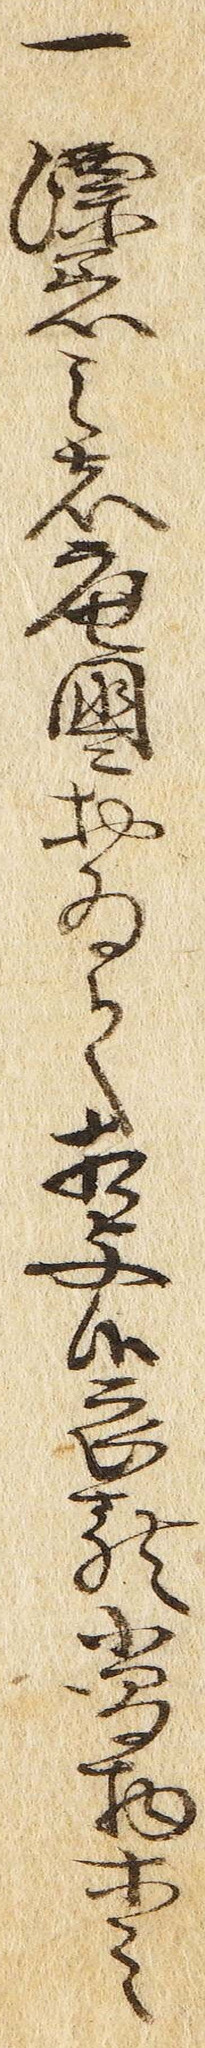一漂着之者唐国ニおゐて相与候衣類小間物等之
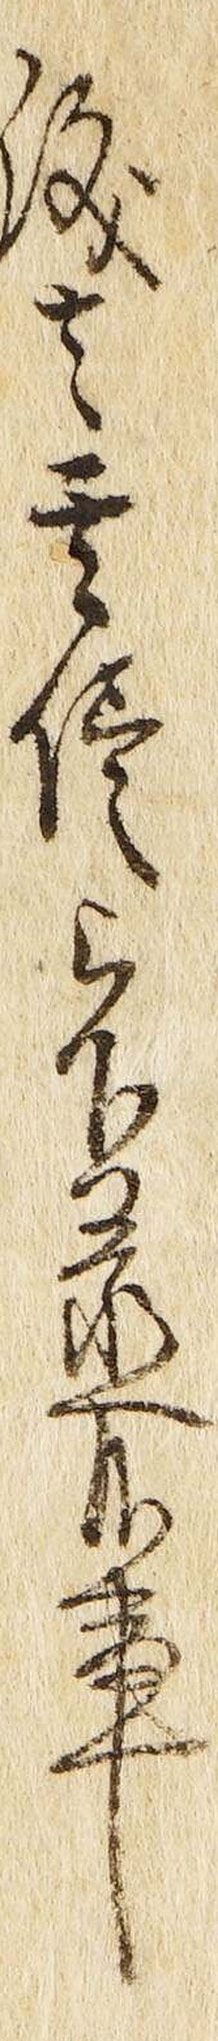儀は其儘被下置候事
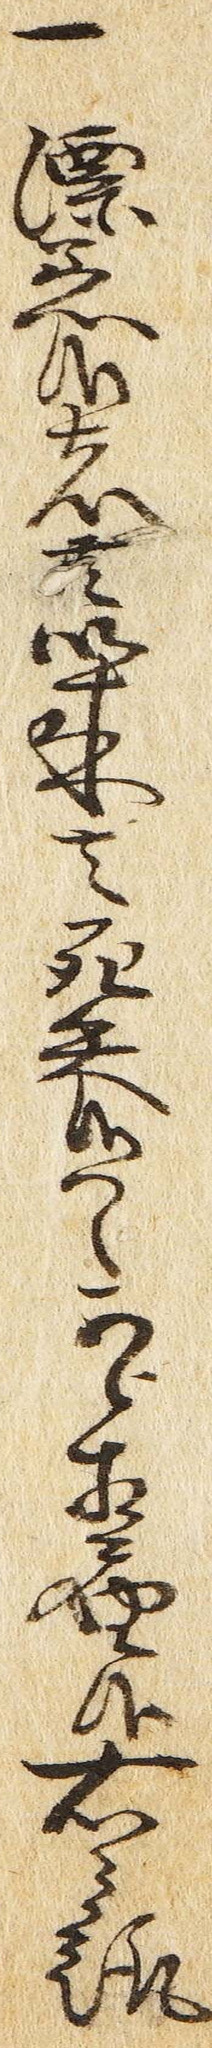一漂着候者共以来は死失候ハヽ可被相届候右之趣
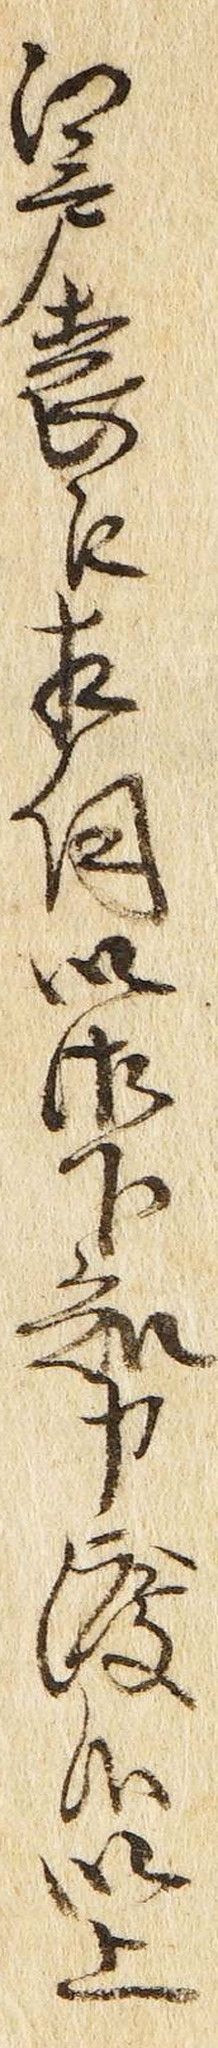江戸表江相伺以御下知申渡候以上
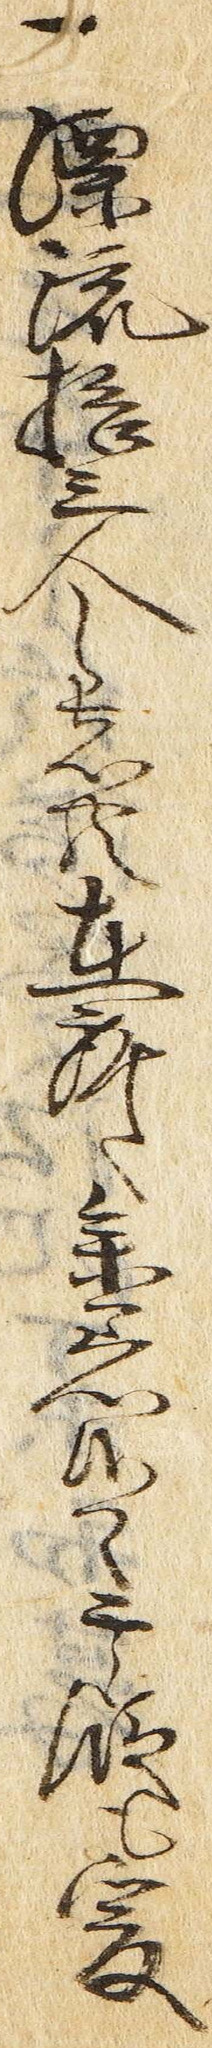一漂流拾三人之者共在所へ参着候ハヽ其段も爰
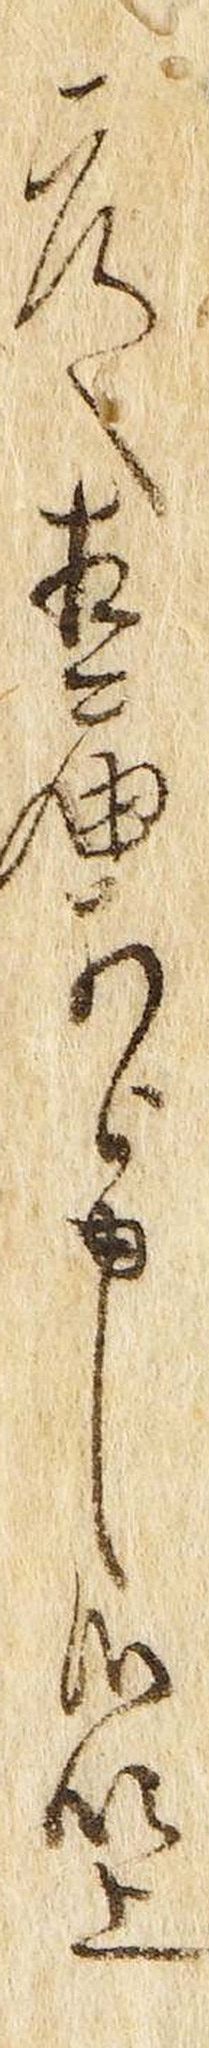元へ相届可被申候以上
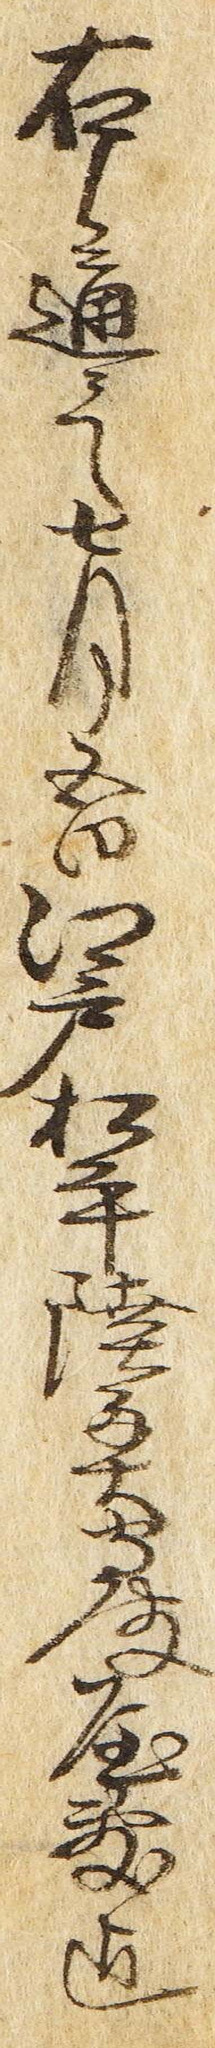右之通ニて七月五日江戸松平陸奥守殿屋敷迄
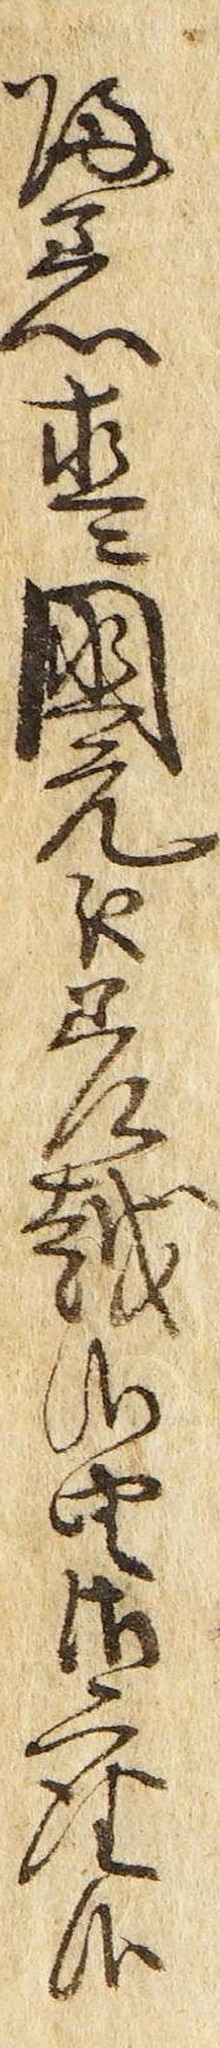帰着直ニ国元江差越候由御座候

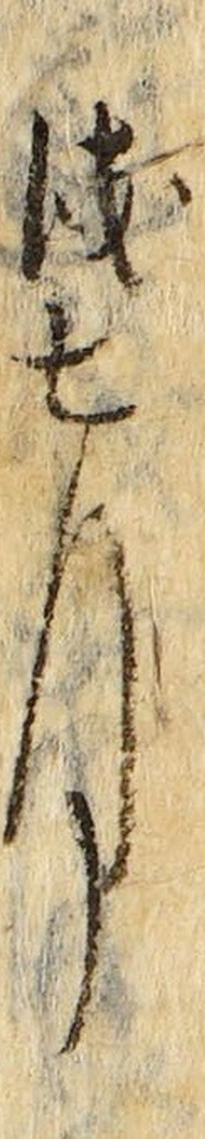戌七月
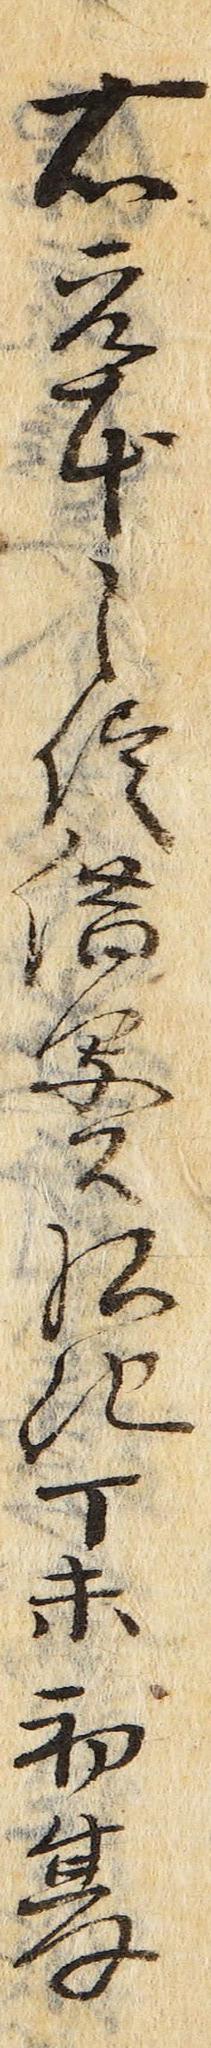右元本之儘借写ス弘化丁未初夏
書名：奥州仙台領之者唐国江漂流一件
